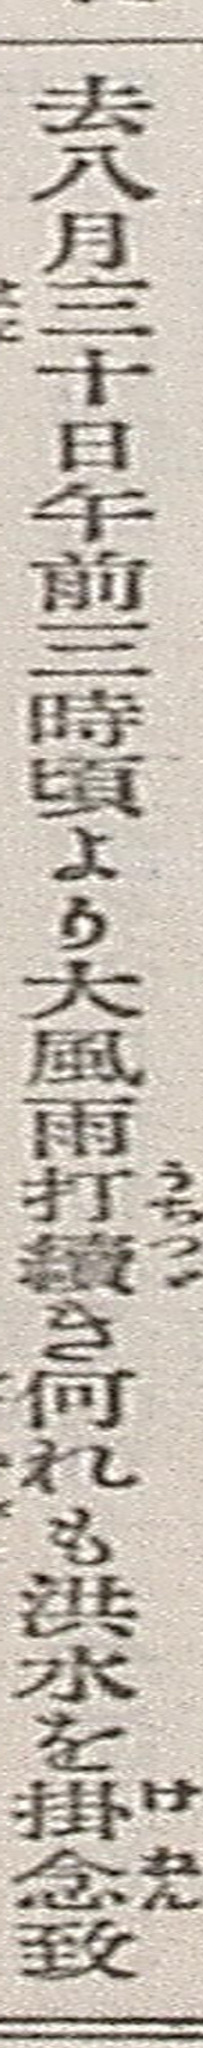去八月三十日午前三時頃より大風雨打続き何れも洪水を掛念致
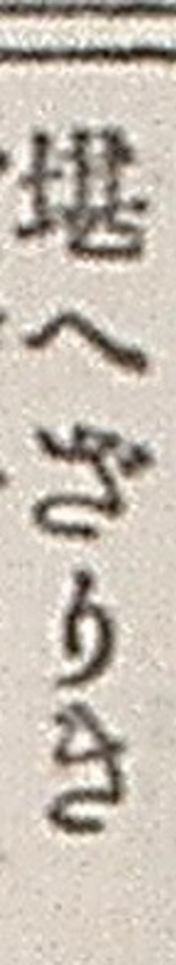堪へざりき
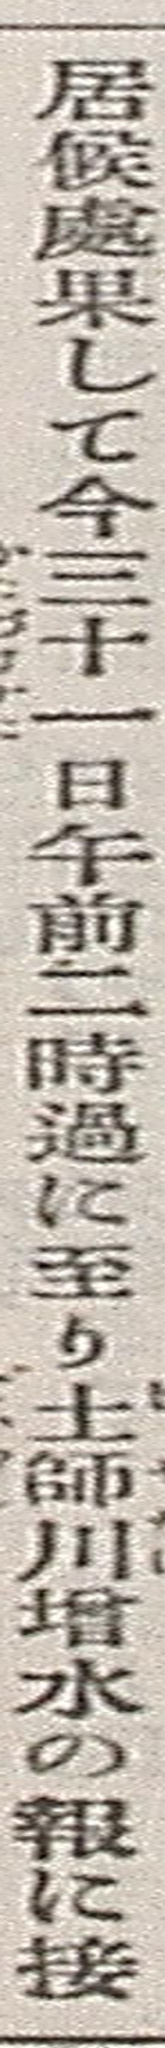居候処果して今三十一日午前二時過に至り土師川増水の報に接
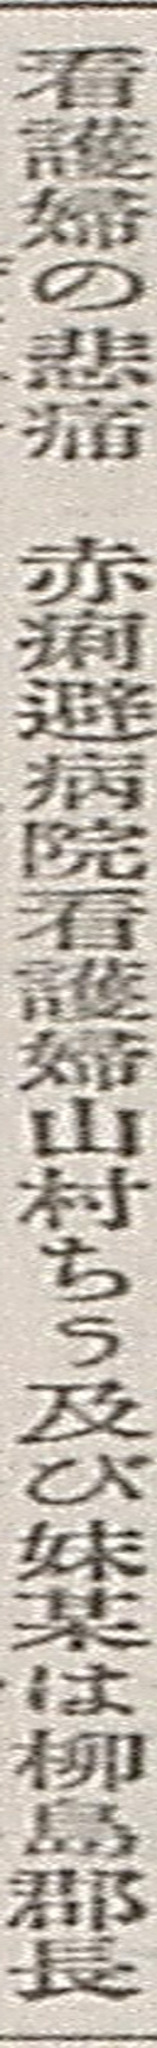看護婦の悲痛赤痢避病院看護婦山村ちうおよび妹某は柳島群長
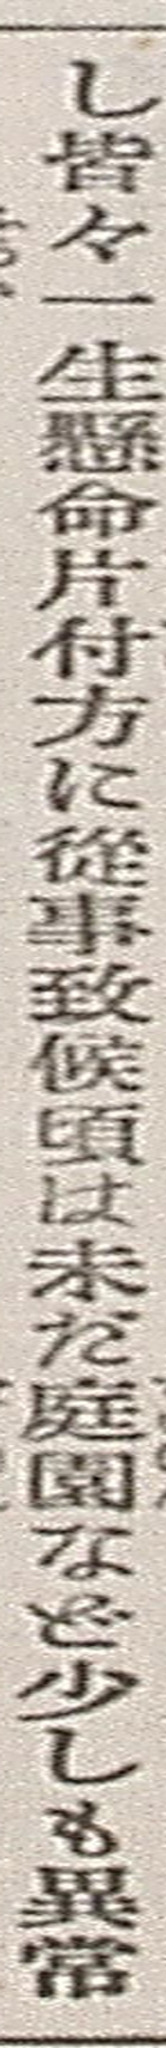し皆々一生懸命片付方に従事致候頃は未だ庭園など少も異常
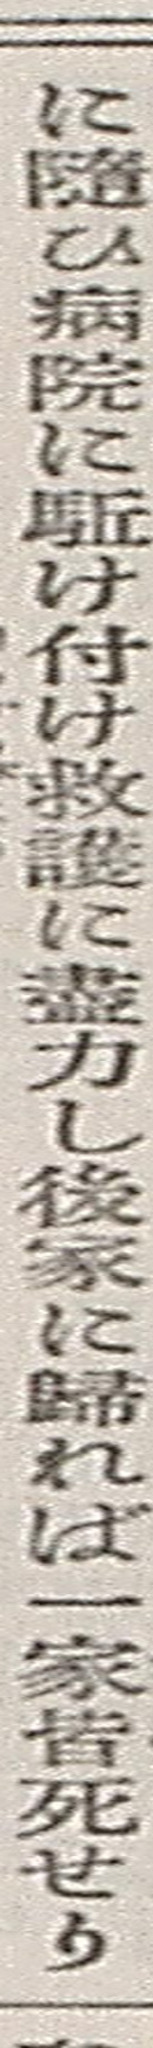に随ひ病院に駆け付け救護に尽力し後家に帰れば一家皆死せり
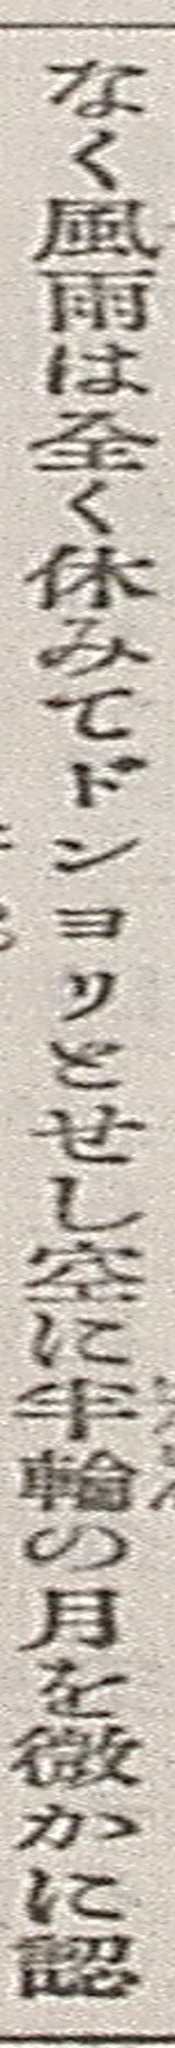なく風雨は全く休みてドンヨリとせし空に半輪の月を微かに認
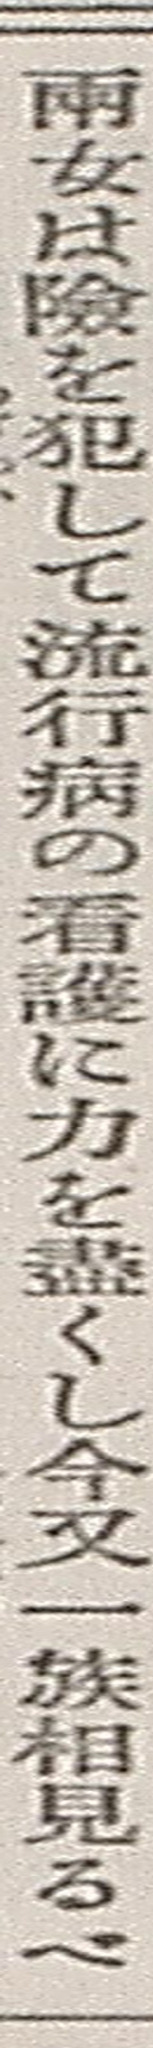両女は険を犯して流行病の看護に力を盡くし今又一族相見るべ
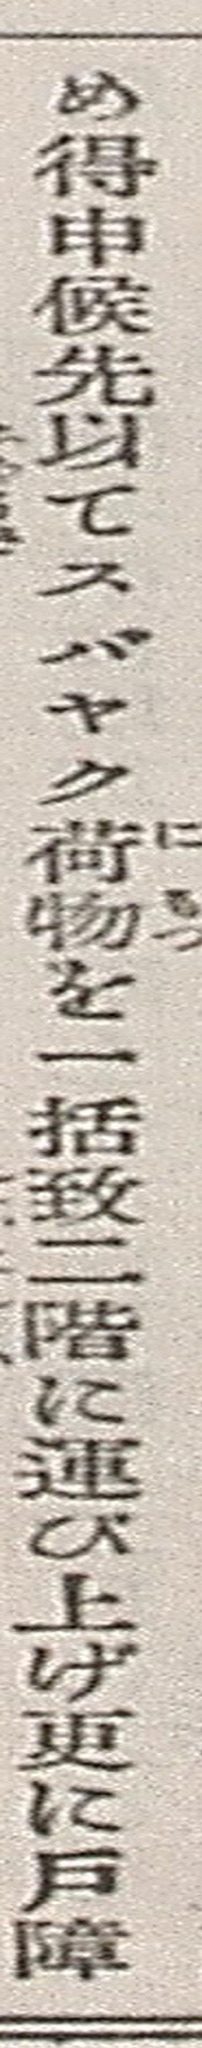め得申候先以てスバヤク荷物を一括致二階に運び上げ更に戸障
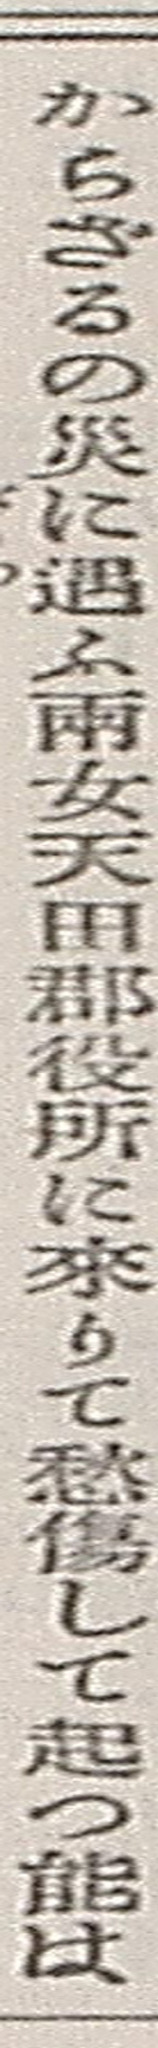からざるの災に遭ふ両女天田郡役所に来りて愁傷して起つ能は
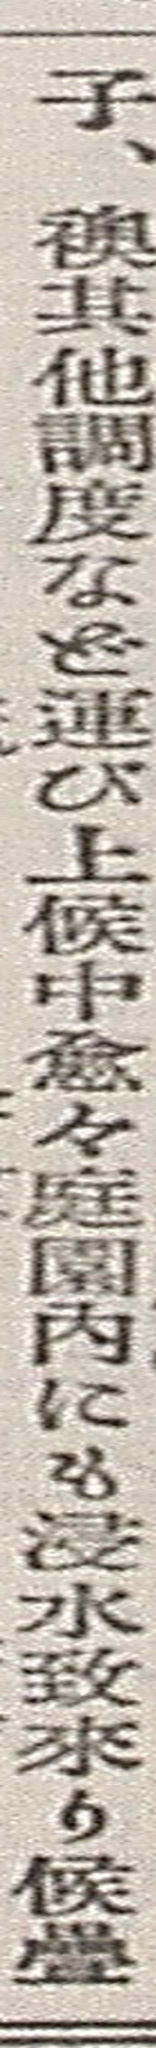子、襖其他調度などは運び上候中愈々庭園内にも浸水致来り候畳
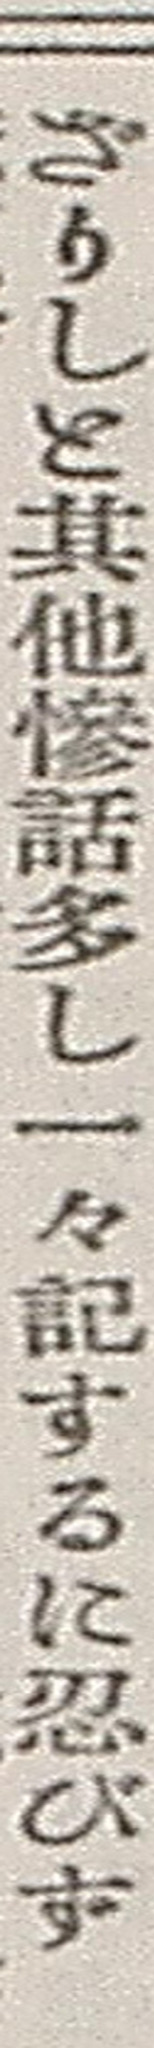ざりしと其他惨話多し一々記するに忍びず
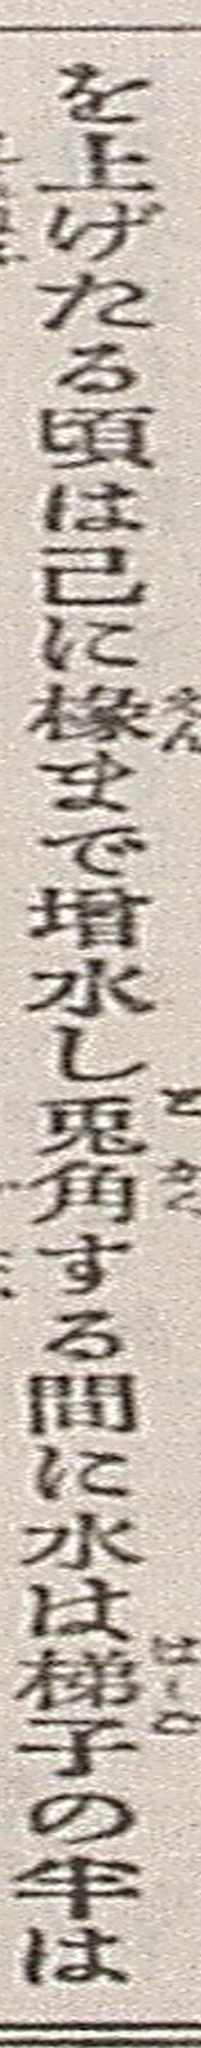を上げたる頃は已に掾まで増水し兎角する間に水は梯子の半は
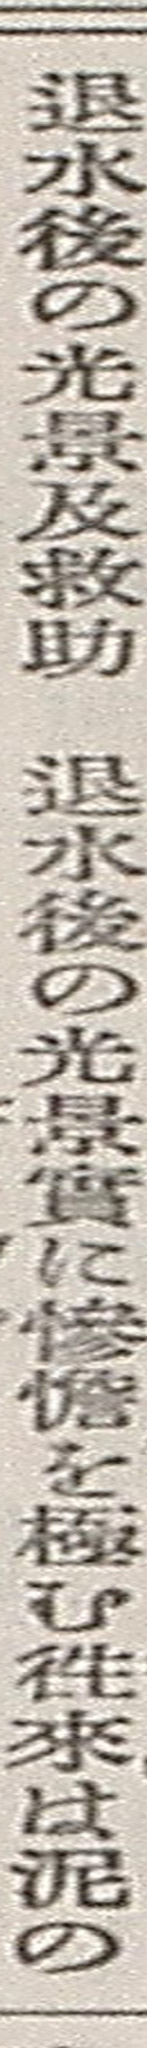退水後の光景及救助退水後の光景実に惨憺を極む往来は泥の
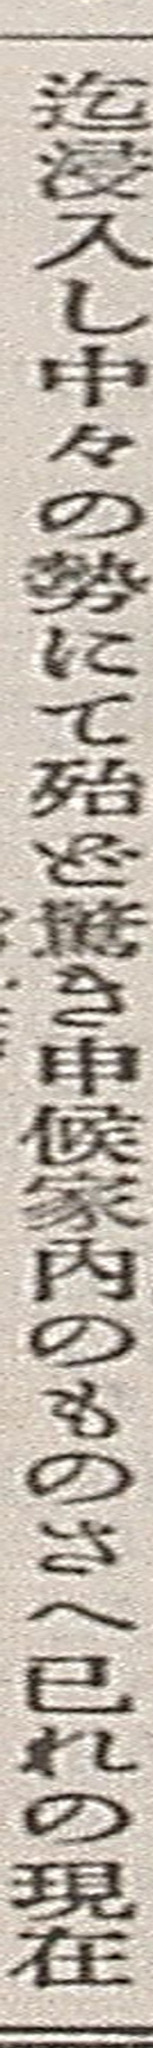迄侵入し中々の勢にて殆ど驚き申候家内のものさへ己れの現在
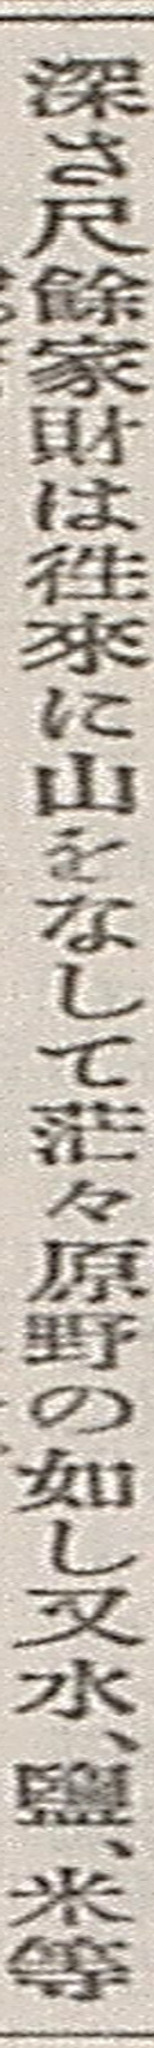深さ尺餘家財は往来に山をなして茫々原野の如し又水、鹽、米等
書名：風俗畫報臨時増刊第百二十六號　洪水被害録（中）
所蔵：東京大学地震研究所図書室 Earthquake Research Institute Library, The University of Tokyo, JAPAN
